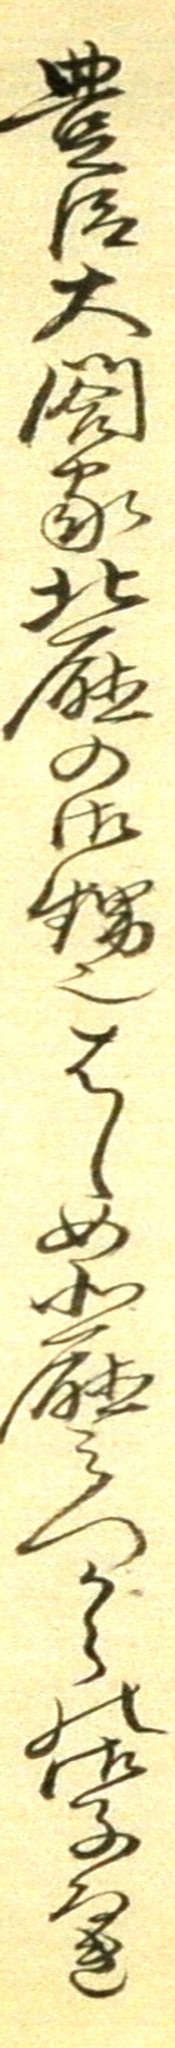豊臣太閤家北庁の御甥也はしめ北庁みつからの子なき
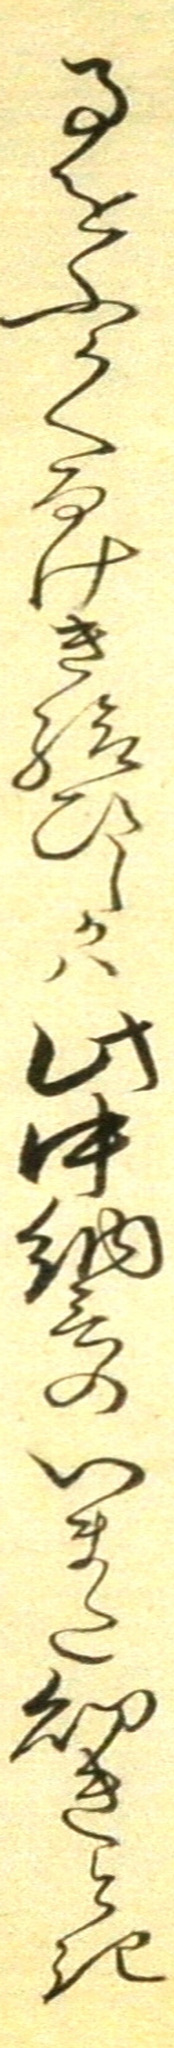事をふかくなけき給ひしかハ此中納言のいまた幼きとき
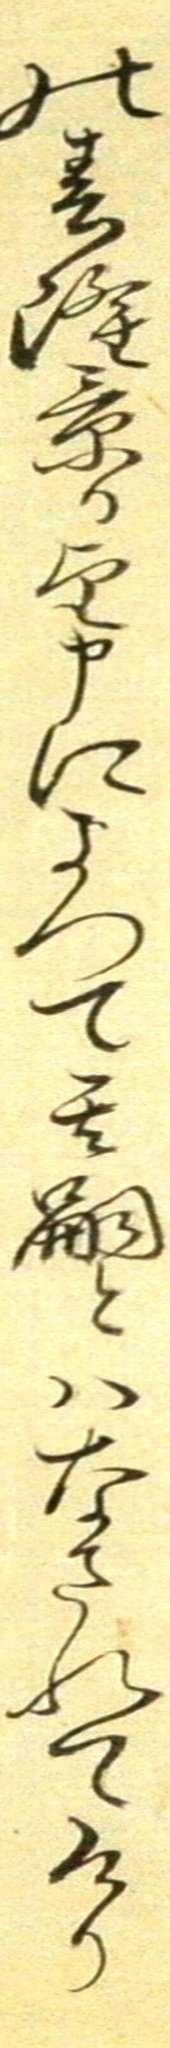の春隆景か望申によつて其嗣とハなされてけり
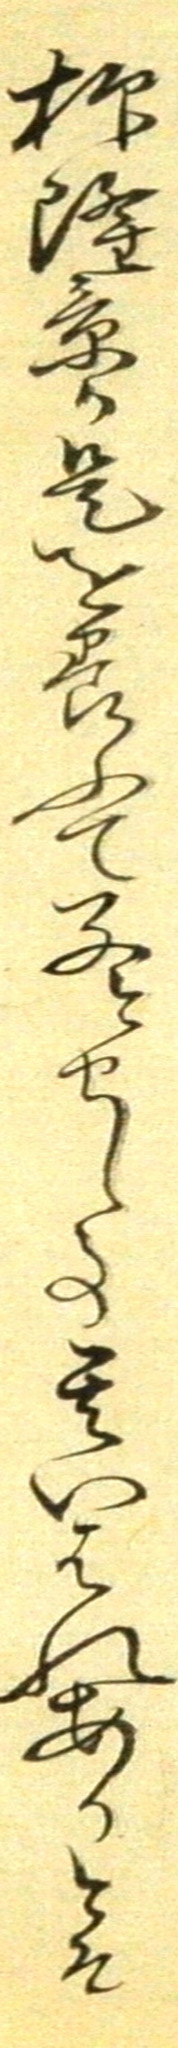抑隆景か是を養ふて子とせし事其いはれありとそ
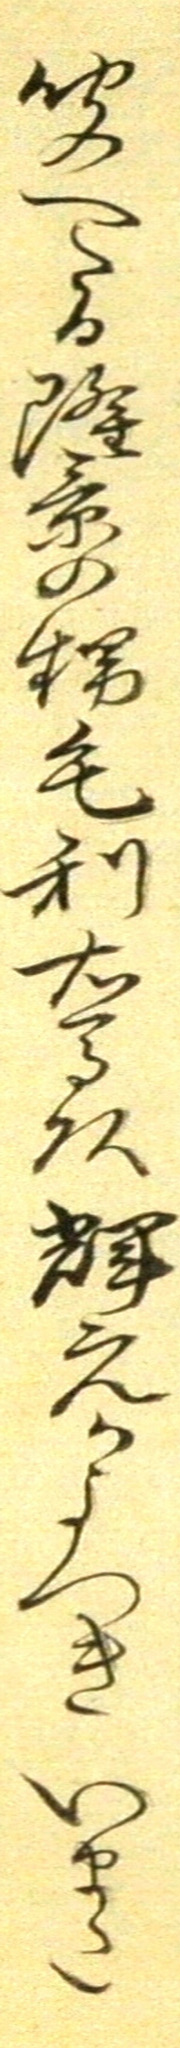聞へたる隆景の甥毛利右馬頭輝元かよつきいまた
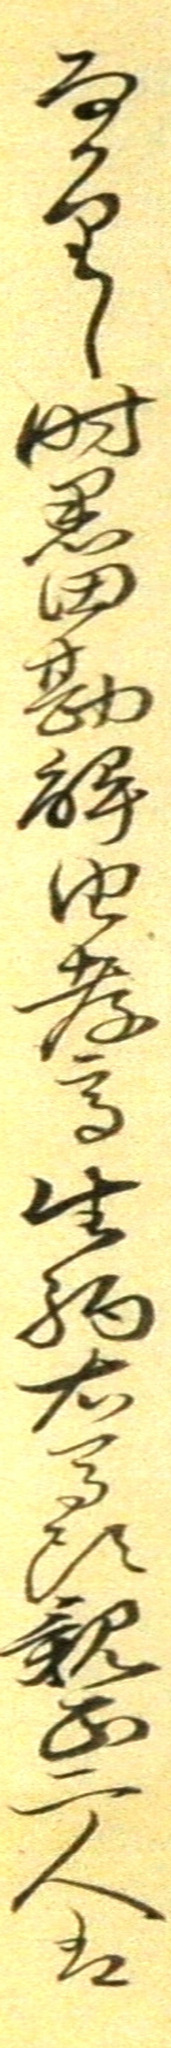なかりし時黒田勘解由孝高生駒右馬頭親正二人は

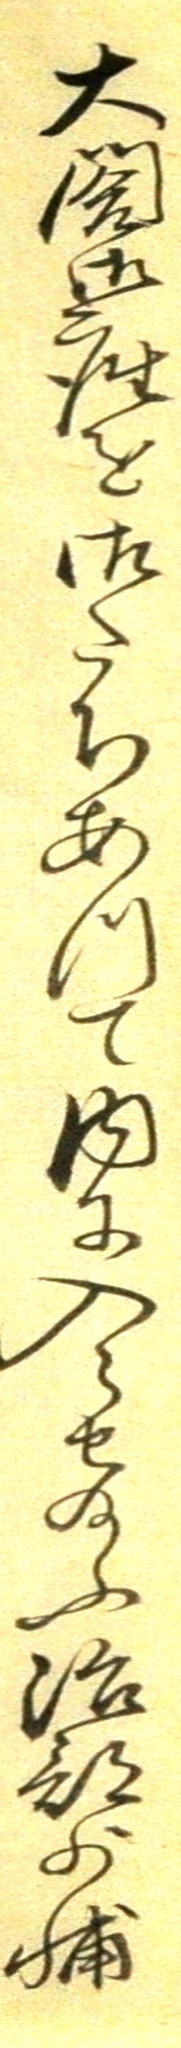太閤御座を御たちあつて内に入らせ給ふ治部少輔
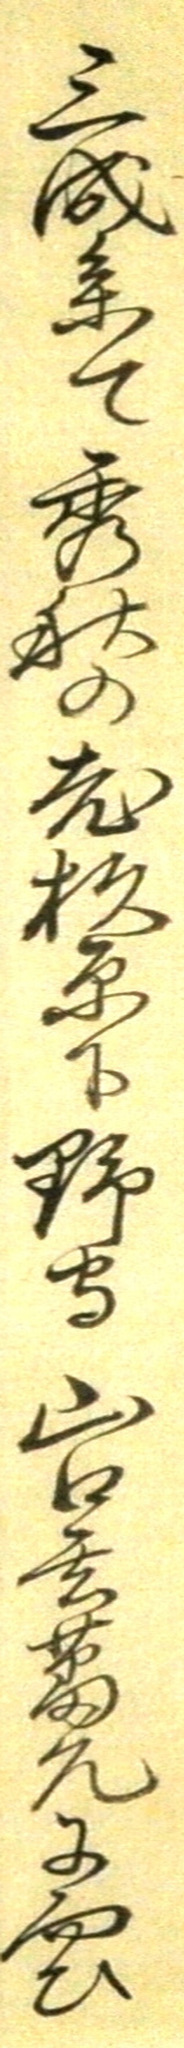三成参て秀秋の老杉原下野守山口玄蕃允に向ひ
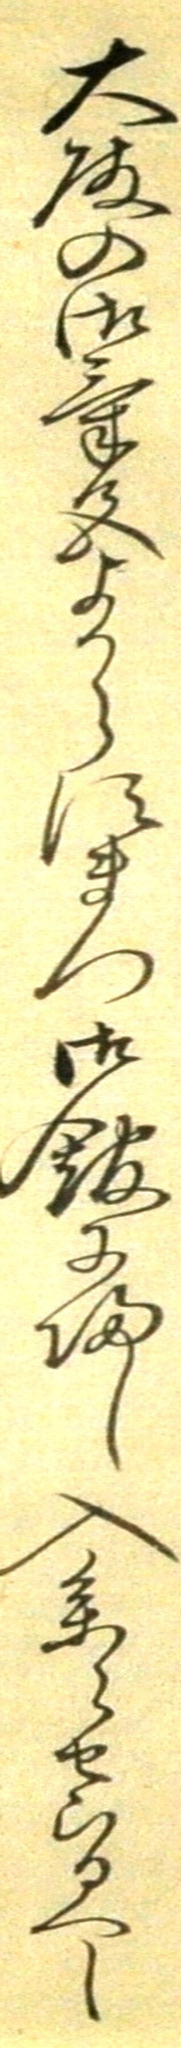大殿の御気色よからすまつ御館に帰し入参らせひるへし
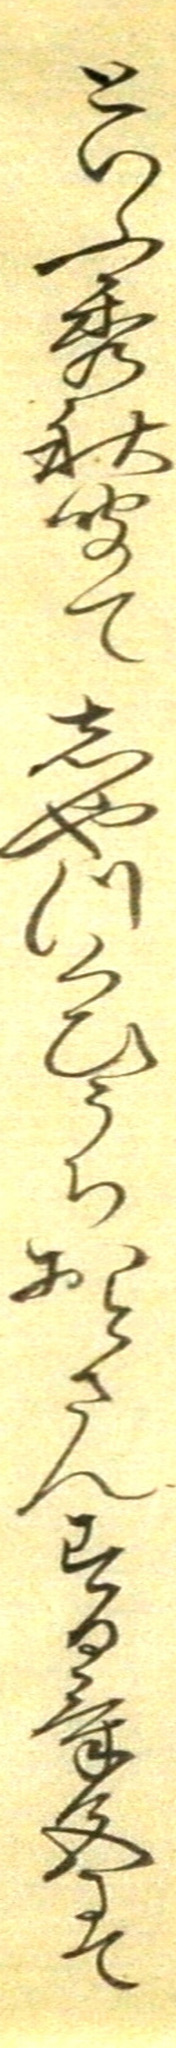といふ秀秋聞てしやつかひうちおとまんする気色にて
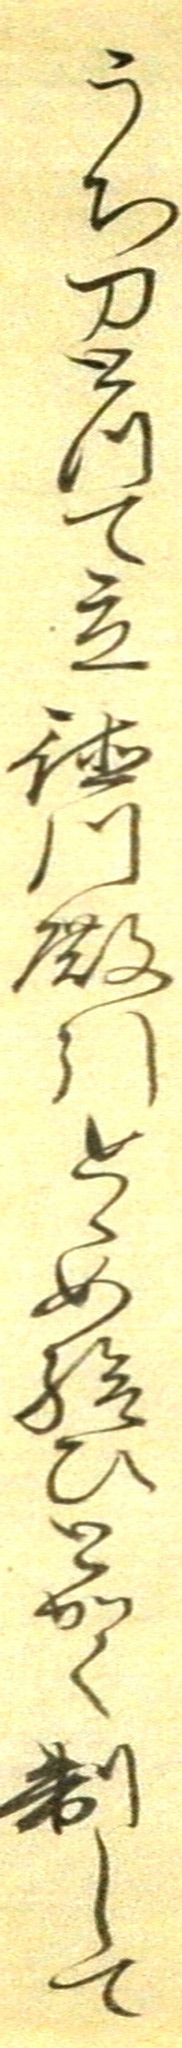うち刀とつて立徳川殿引とゝめ給ひとかく制して
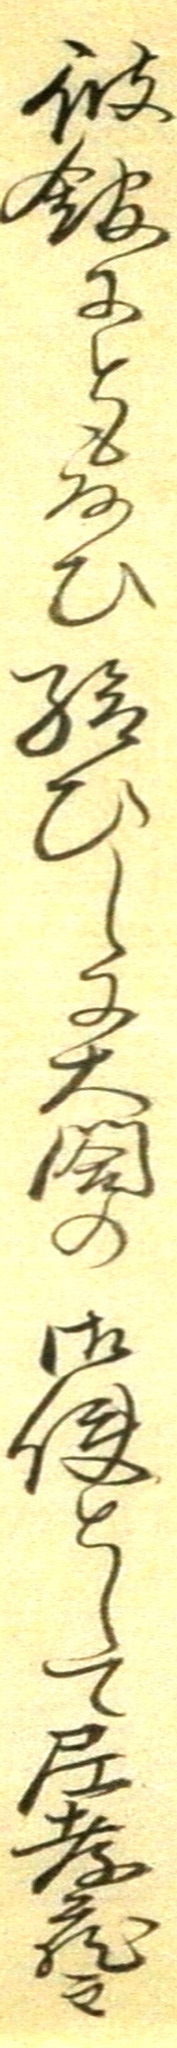彼館にともなひ給ひしに太閤の御使として尼孝蔵主
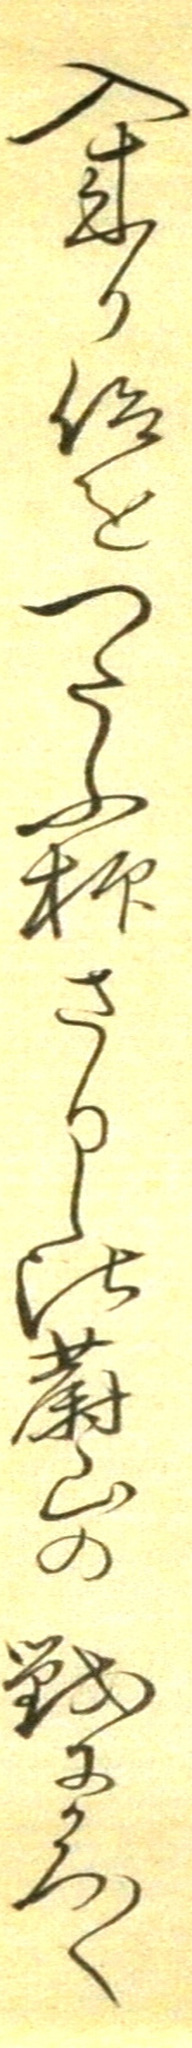入来り仰をつたふ様さる頃蔚山の戦にかろ〳〵
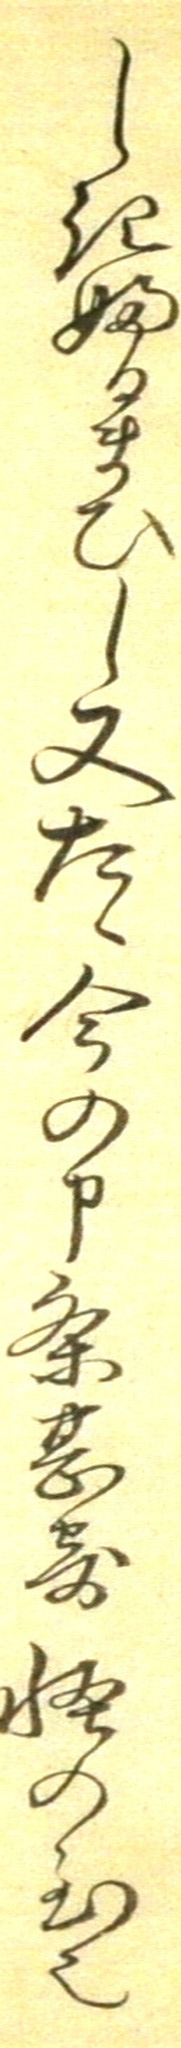しきふるまひし又たゝ今の申条甚寄軽の至也
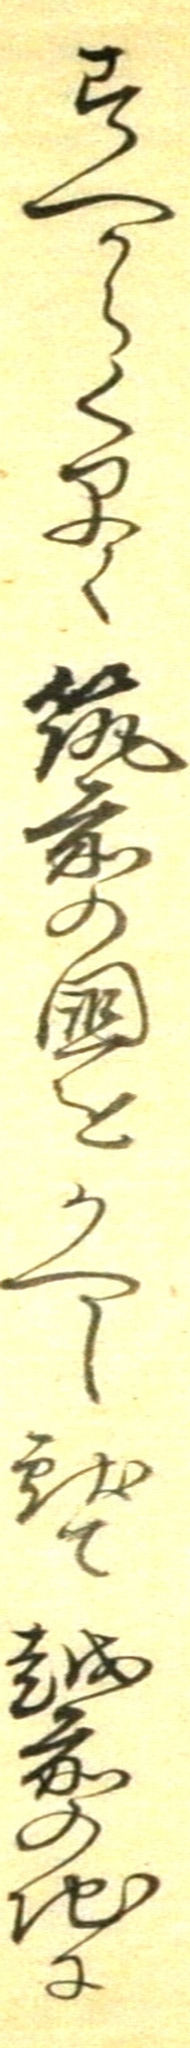すへからく早々筑前の国をかへし献て越前の地に
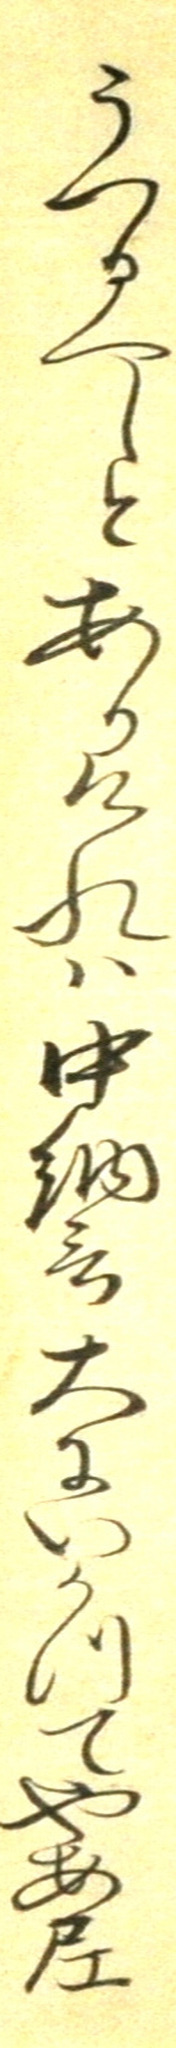うつるへしとありけれは中納言大にいかつてやあ尼
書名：藩翰譜（十二・上）
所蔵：伊那市立高遠町図書館・合同会社AMANE
